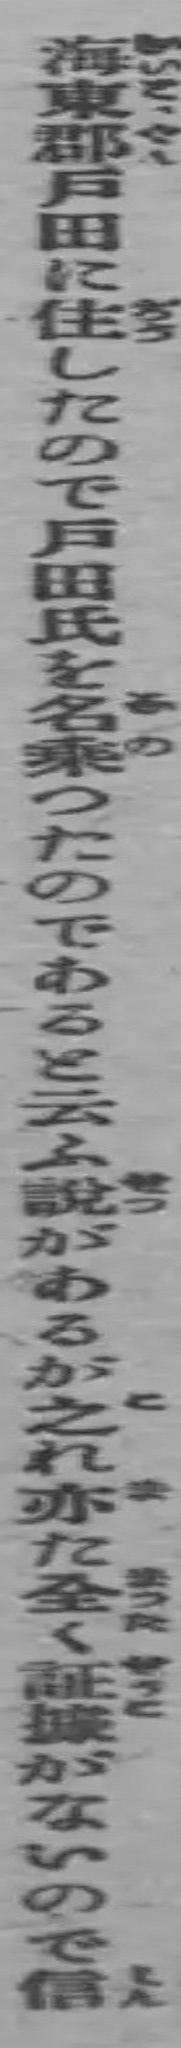海東郡戸田に住したので戸田氏を名乗つたのであるという云ふ説があるが之れ亦た全く証拠がないので信
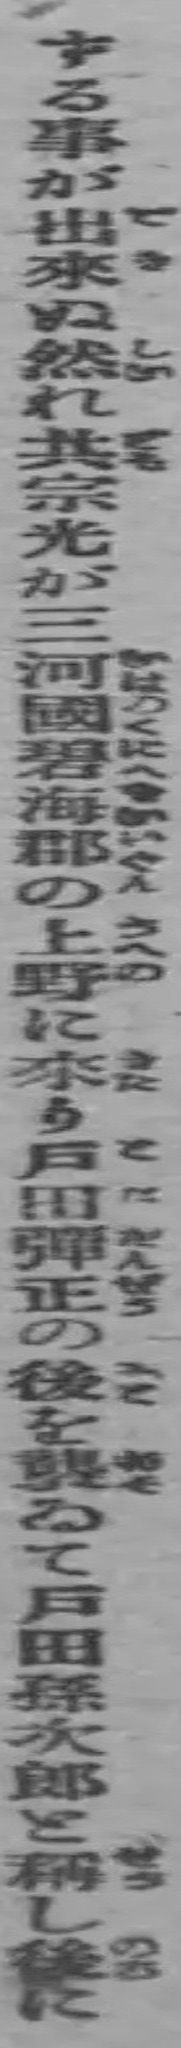ずる事が出来ぬ然れ共宗光が三河国碧海郡の上野に来り戸田弾正の後を襲ゐて戸田孫次郎と称し後に
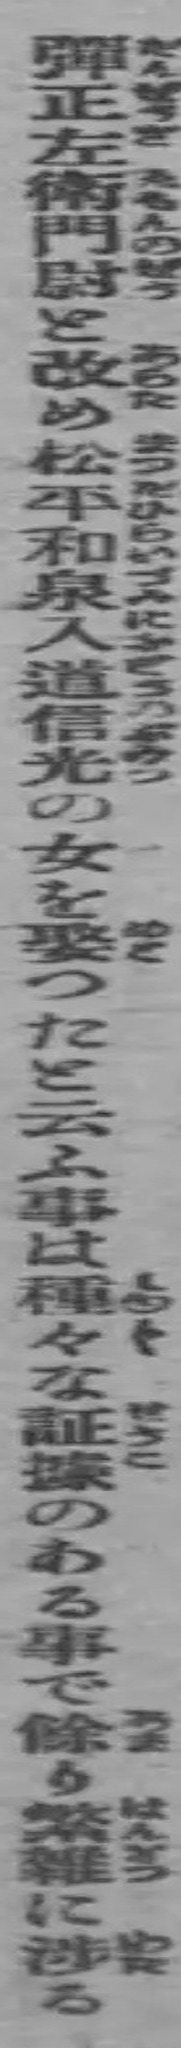弾正左衛門尉と改め松平和泉入道信光の女を娶つたと云ふ事は種々な証拠のある事で余り繁雑に渉る
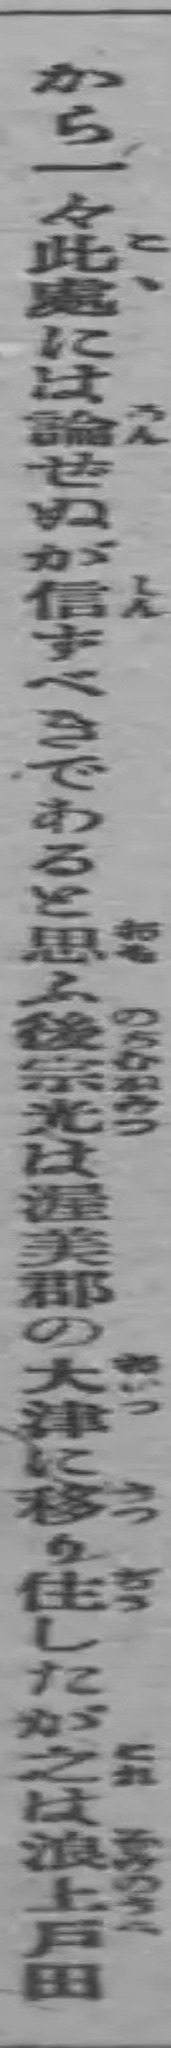から一々此処には論ぜぬが信ずべきであると思ふ後宗光は渥美郡の大津に移り住したが之は浪上戸田
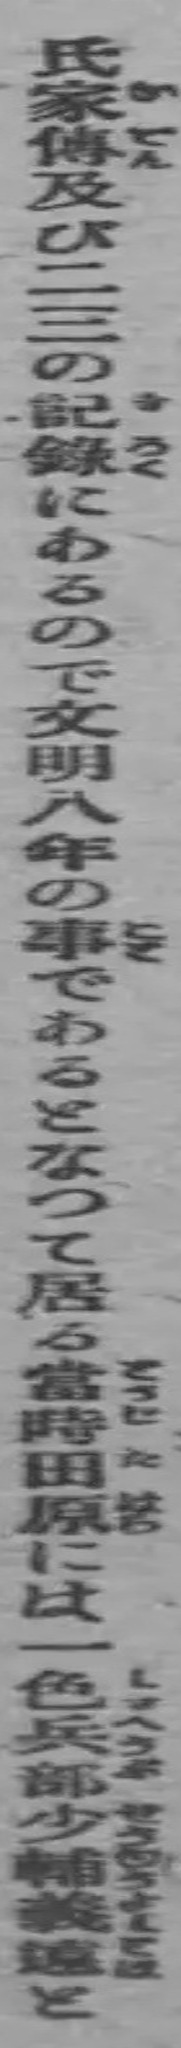氏家伝及びニ三の記録にあるので文明八年の事であるとなつて居る当時田原には一色兵部少輔義遠と
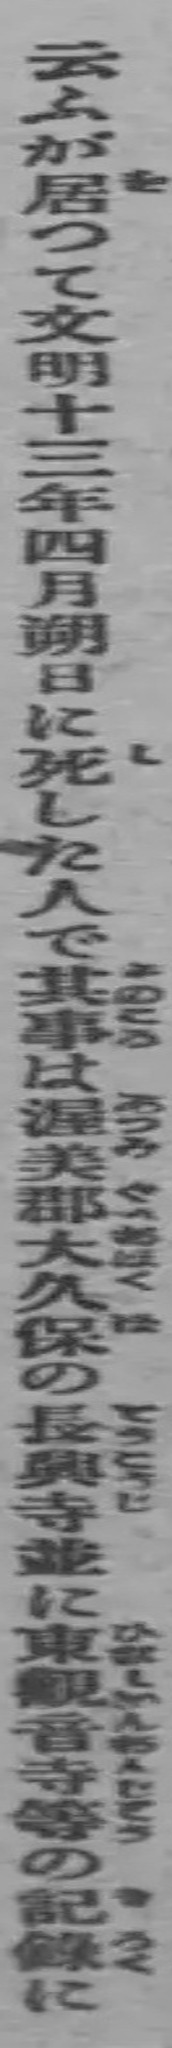云ふが居つて文明十三年四月朔日に死した人で其事は渥美郡大久保の長興寺並に東観音寺等の記録に
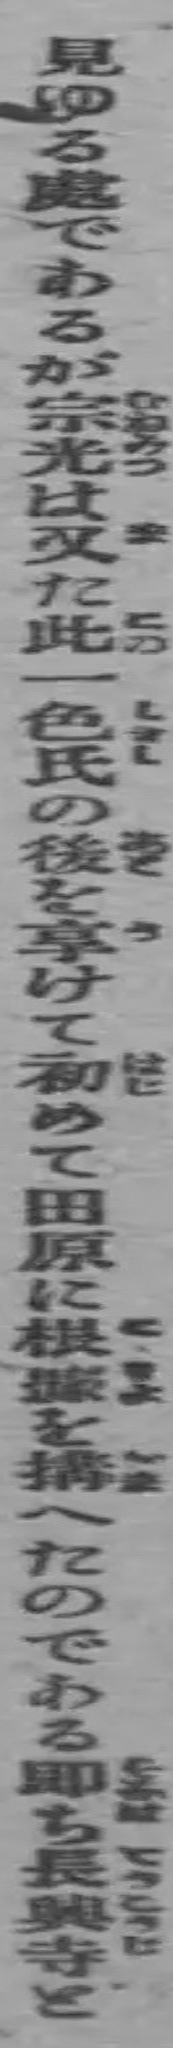見ゆる処であるが宗光は又た此一色氏の後を享けて初めて田原に根拠を搆へたのである即ち長興寺と
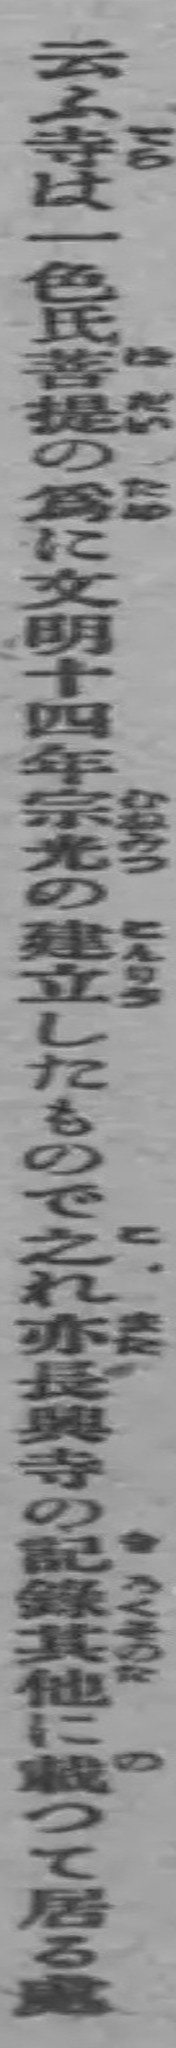云ふ寺は一色氏菩提の為に文明十四年宗光の建立したもので之れ亦長興寺の記録其他に載つて居る処
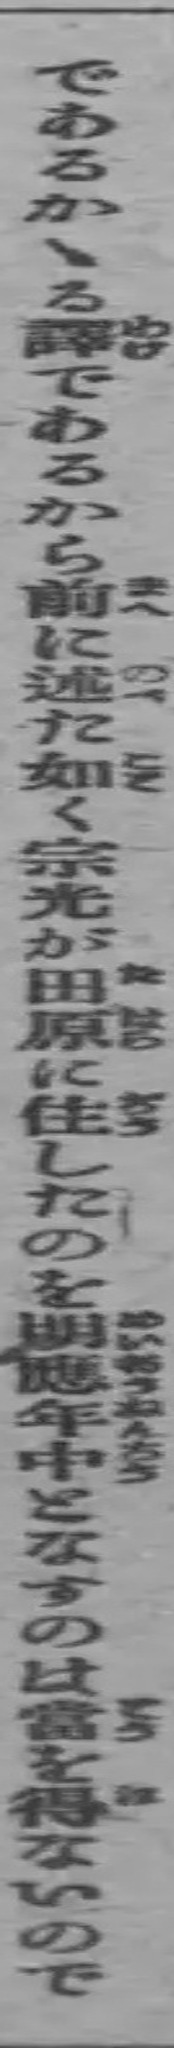であるかゝる訳であるから前に述べた如く宗光が田原に住したのを明応年中となすのは当を得ないので
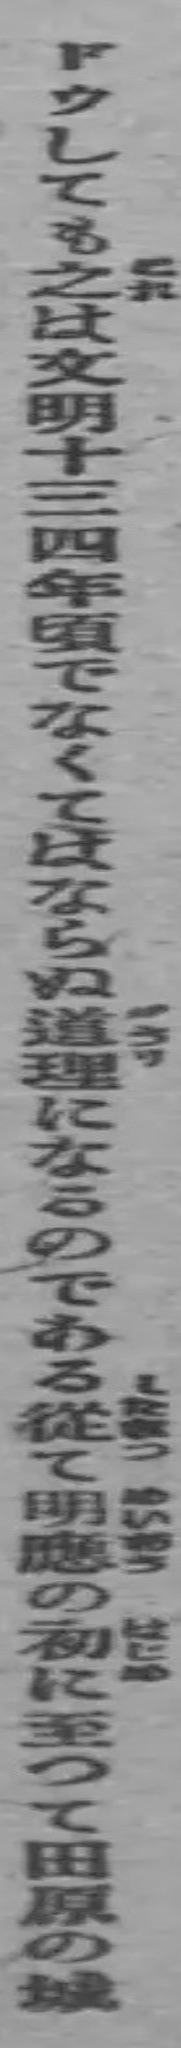ドウしても之は文明十三四年頃でなくてはならぬ道理になるのである従て明応の初に至つて田原の城
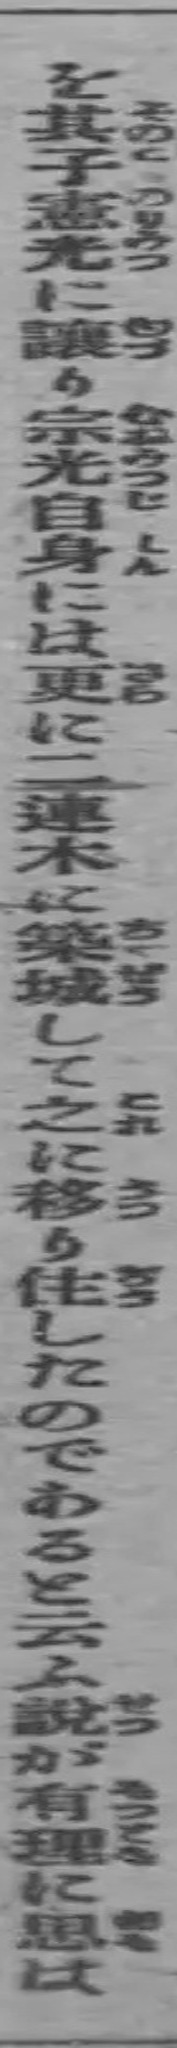を其子憲光に譲り宗光自身には更に二連木に築城して之に移り住したのであると云ふ説が有理と思は
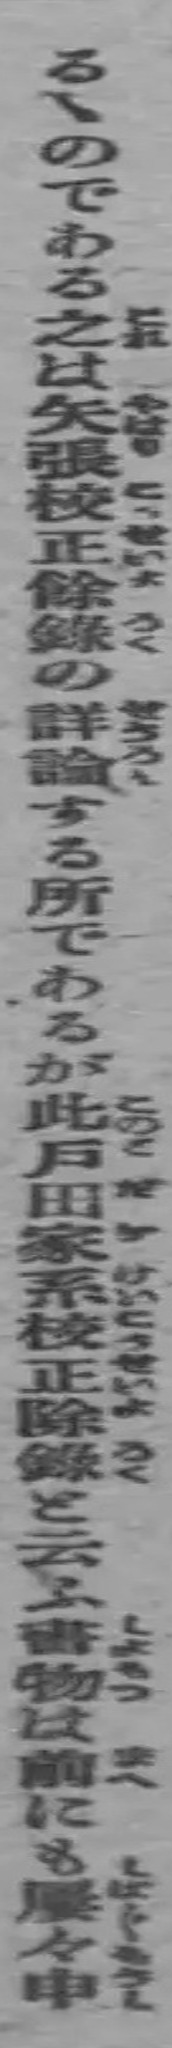るゝのである之は矢張校正余録の詳論する所であるが此戸田家系校正余録と云ふ書物は前にも屡々申
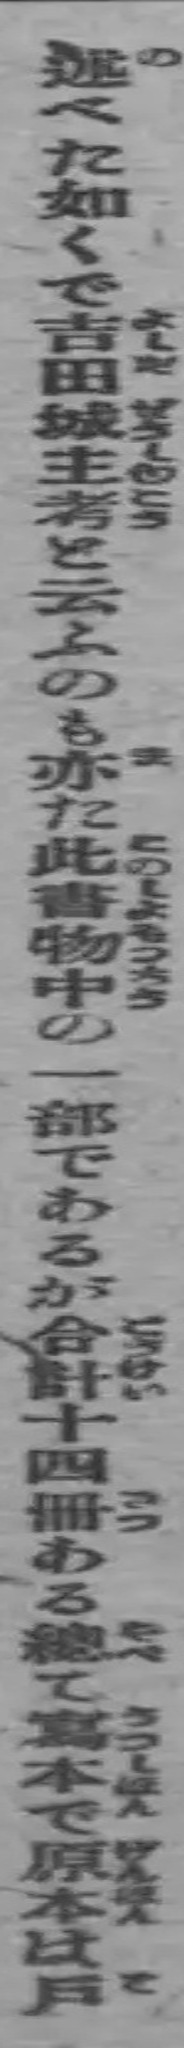述べた如くで吉田城主考と云うふのも亦た此書物中の一部であるが合計十四冊ある総て写本で原本は戸
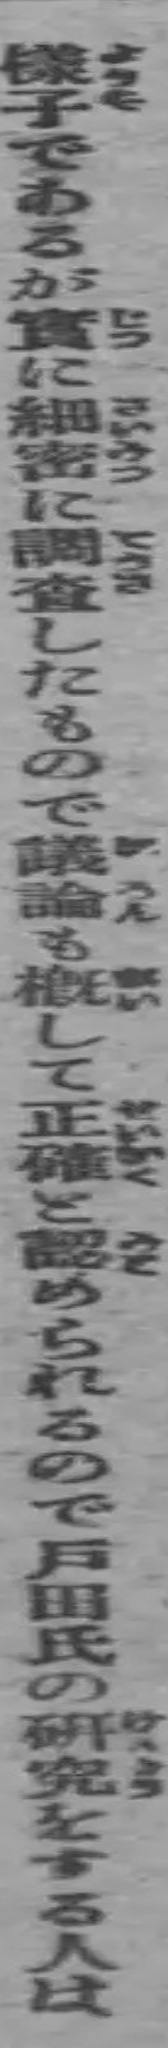様子であるが実に細密に調査したもので議論も概して正確と認められるので戸田氏の研究をする人は
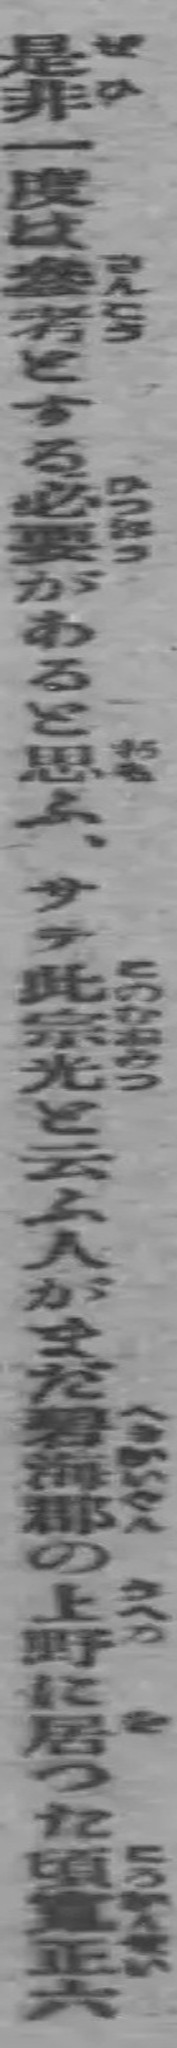是非一度は参考とする必要があると思ふ、サテ此宗光と云ふ人がまだ碧海郡の上野に居つた頃寛正六
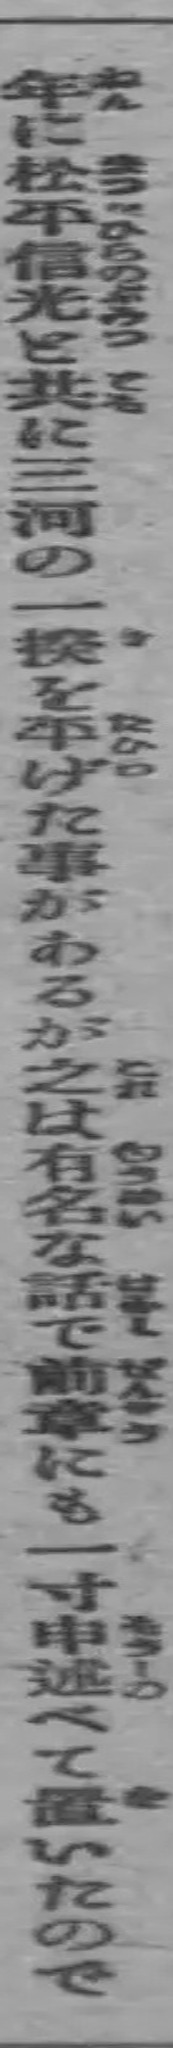年に松平信光と共に三河の一揆を平げた事があるが之は有名な話で前章にも一寸申述べて置いたので
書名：豊橋市史談
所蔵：国立国会図書館 National Diet Library, JAPAN
